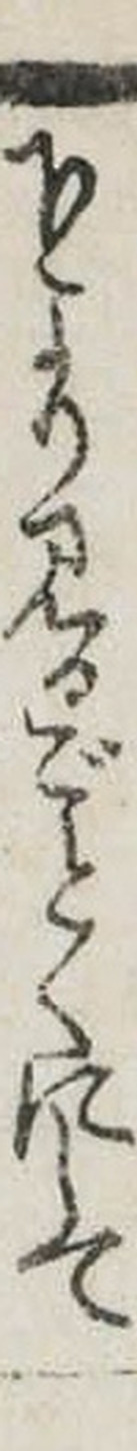下より見るごとくにして
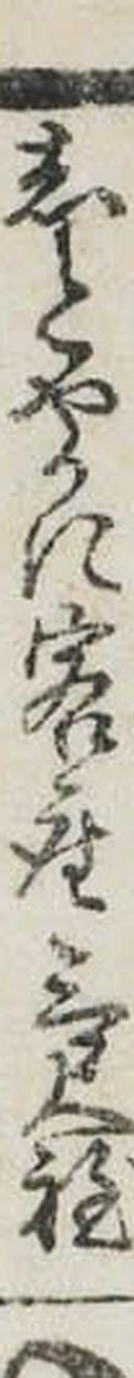しとやかに客座三尺程
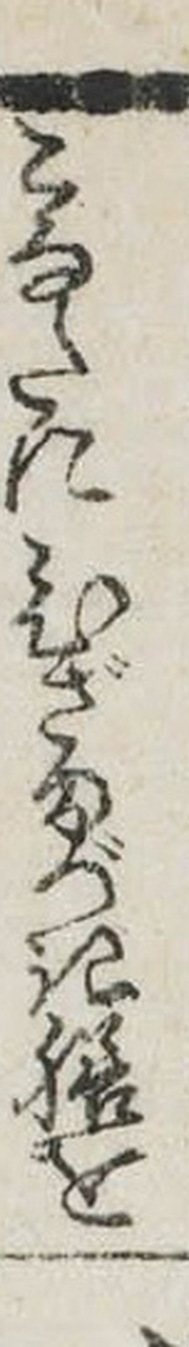こなたにひざまづき膳を
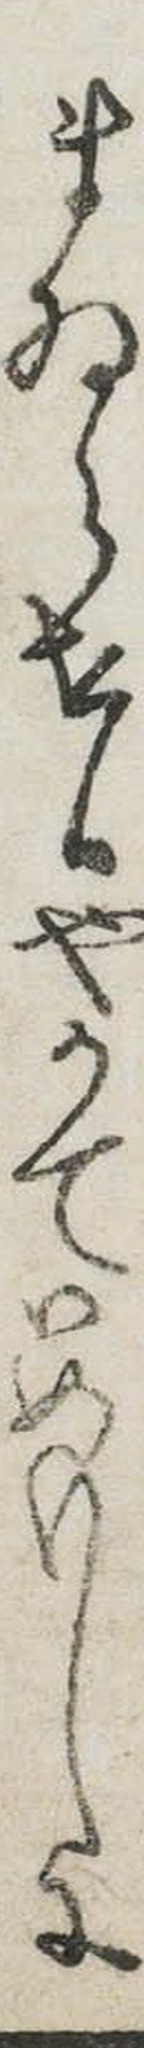まゐらせ候やかて御めもしに
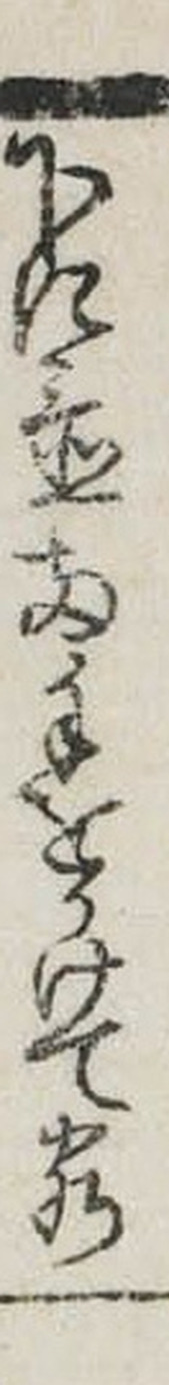下に置両手をかけて客
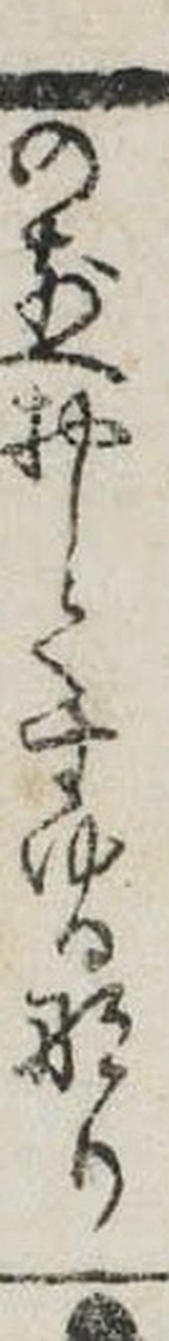の前へおしてすゆるなり
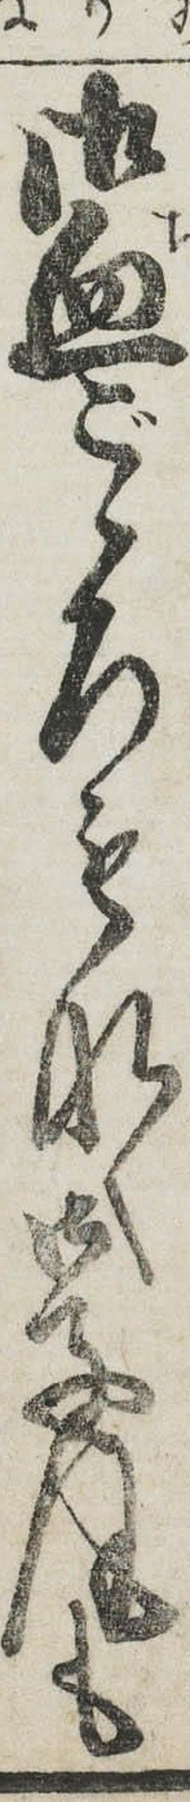御血ごゝろもなく御子さまも
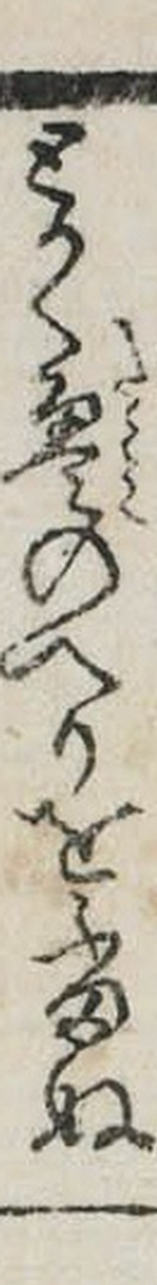とかく畳のへりをふまぬ
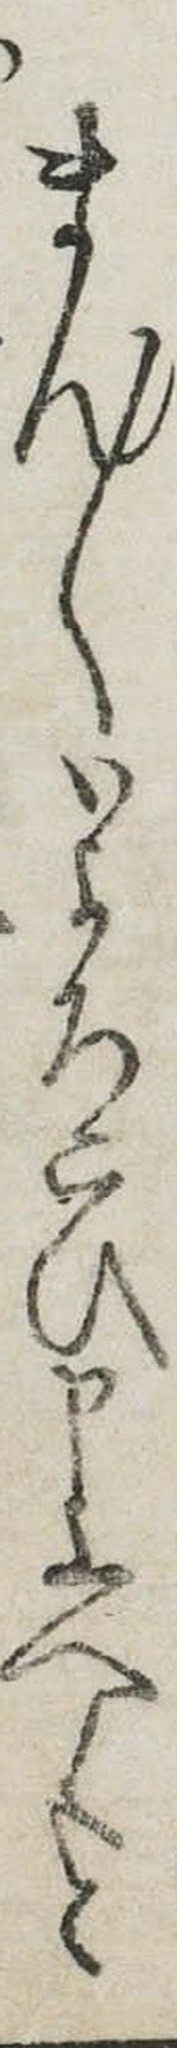まん〳〵御よろこひ申上へくと
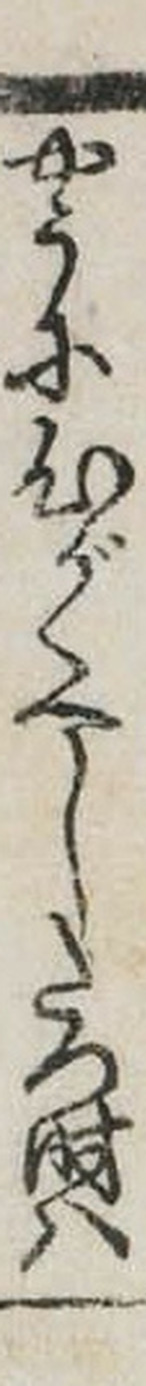やうに心がくへしたつ時は
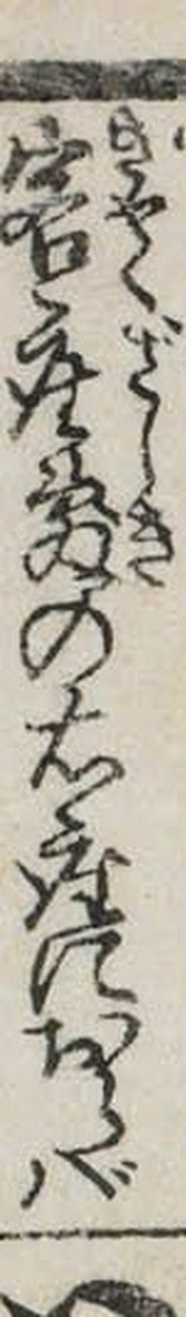客座敷の右座におらば
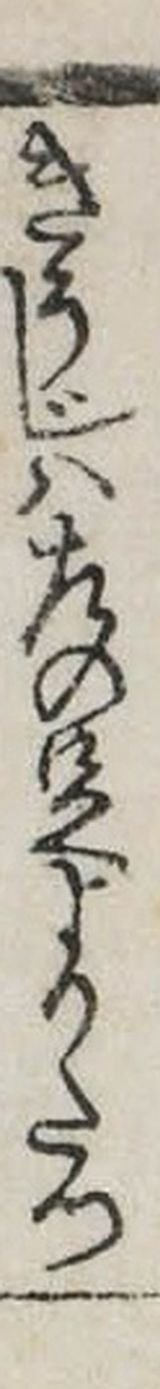きうじは左の足よりたつ
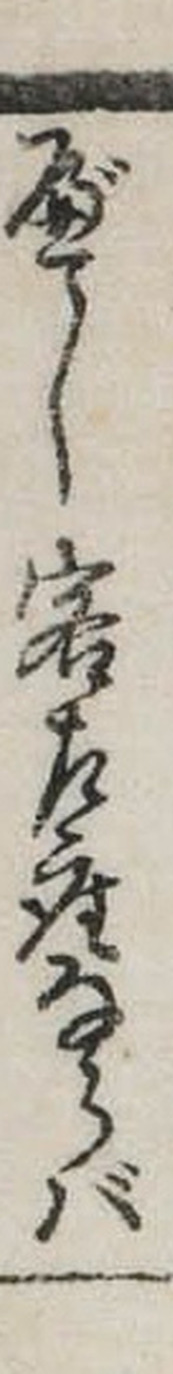べし客左座ならば
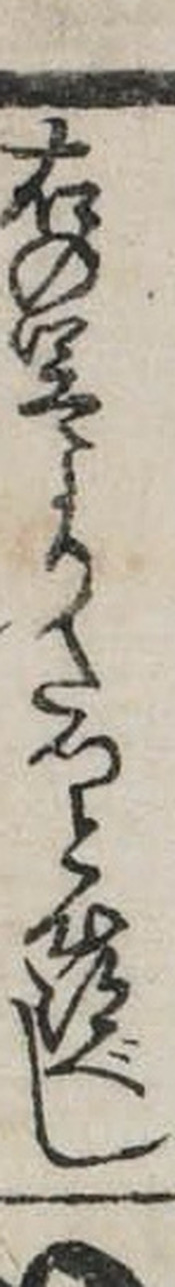右の足よりたつと心得べし
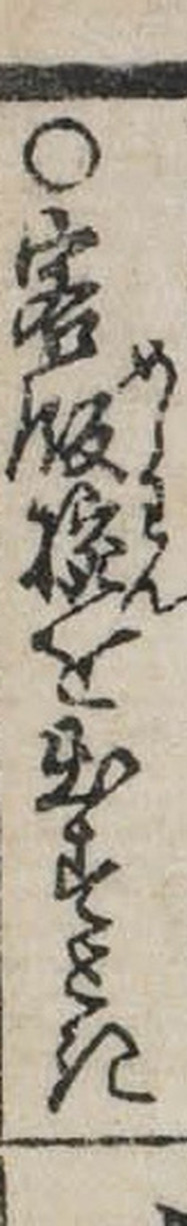○客飯椀を出すとき

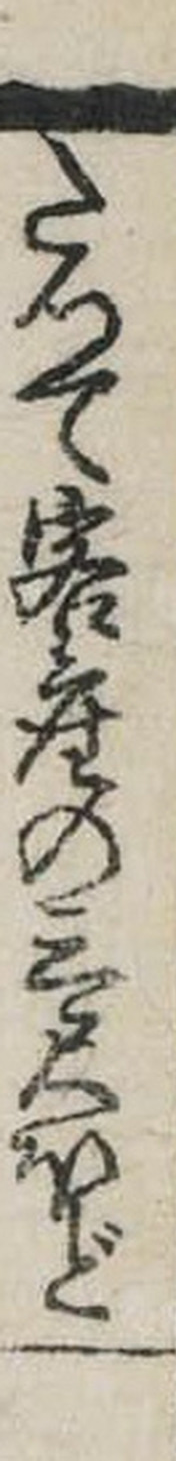たつて客座の三尺ほど
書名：頭書萬用婦人手紙之文言
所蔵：東京学芸大学教育コンテンツアーカイブ
